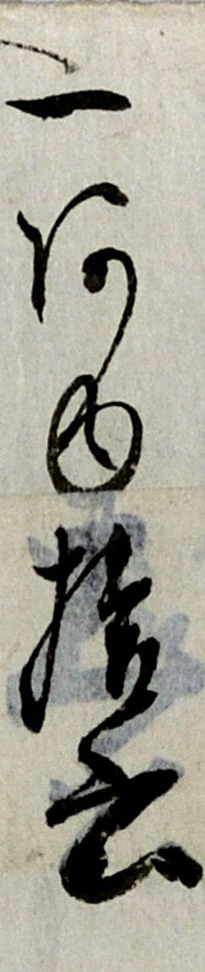一あゆ拾六
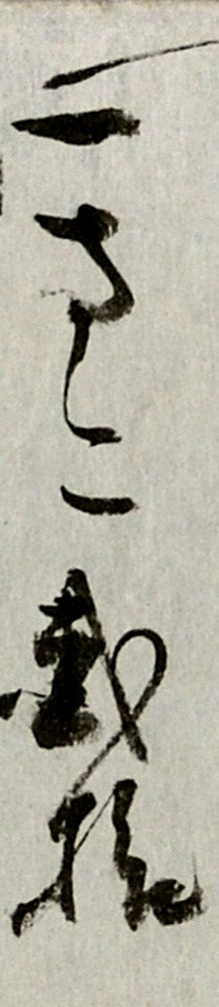一さこ弐拾
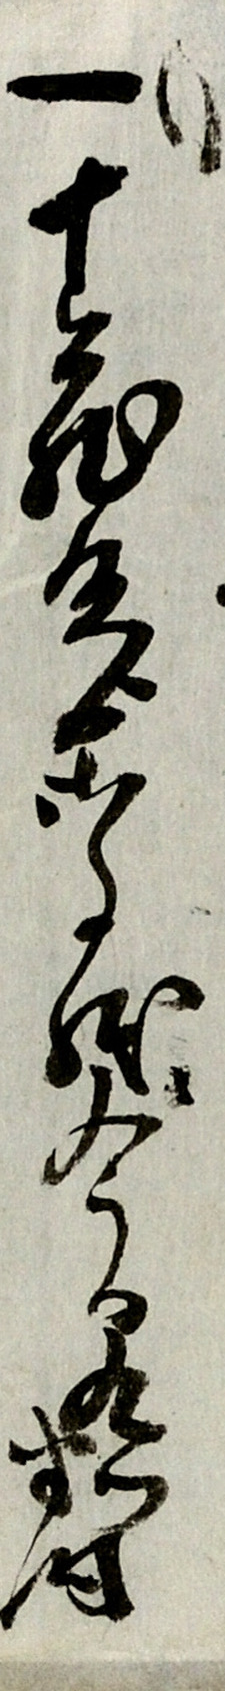一十蔵殿ゟ御手紙今日九ツ半時
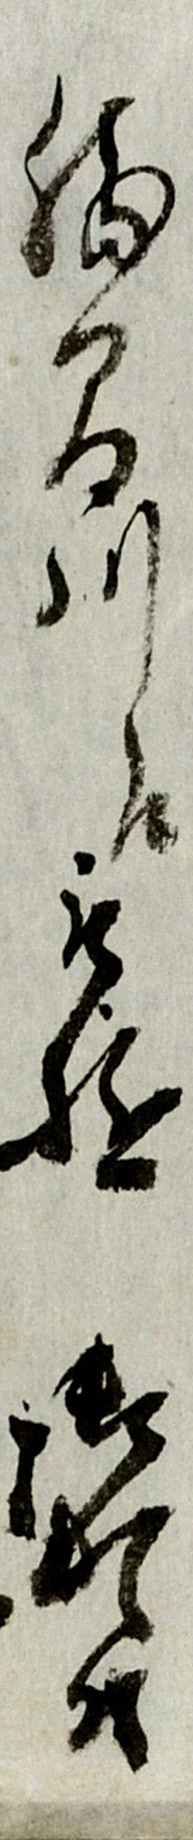勝間川え被遊御成候付
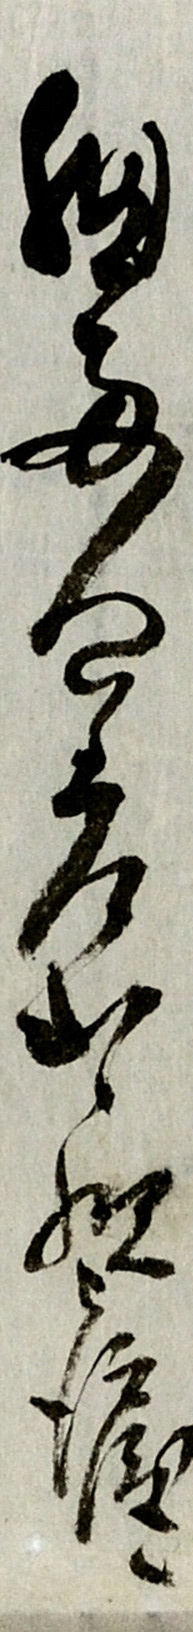綱両人差遣候様被仰渡候
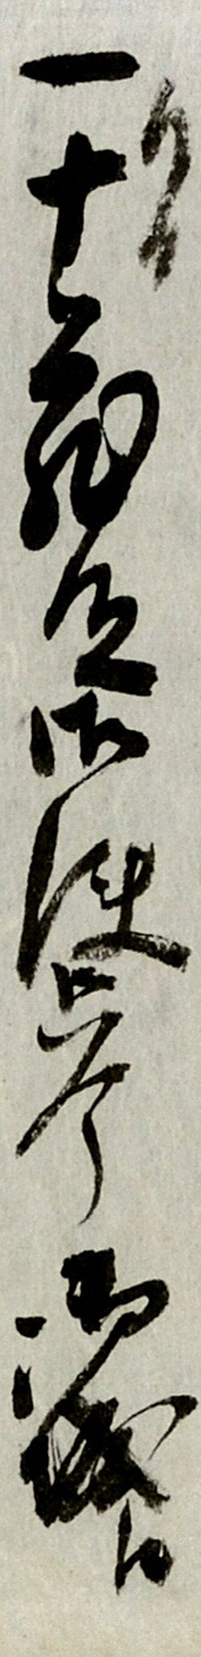一十蔵殿御使只今御城え
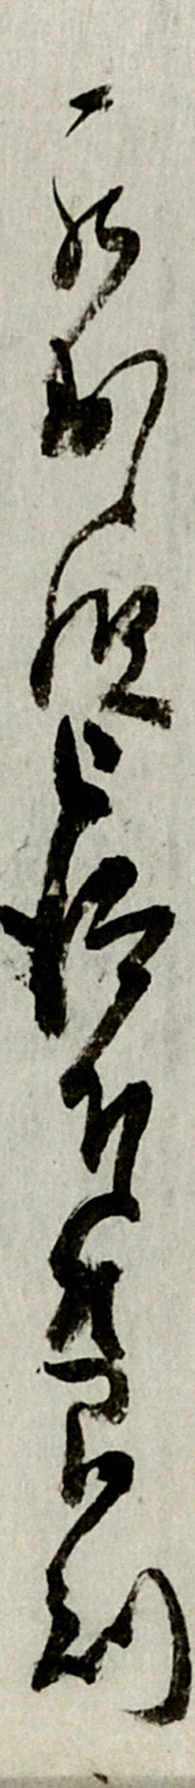罷出候様被仰付候間則
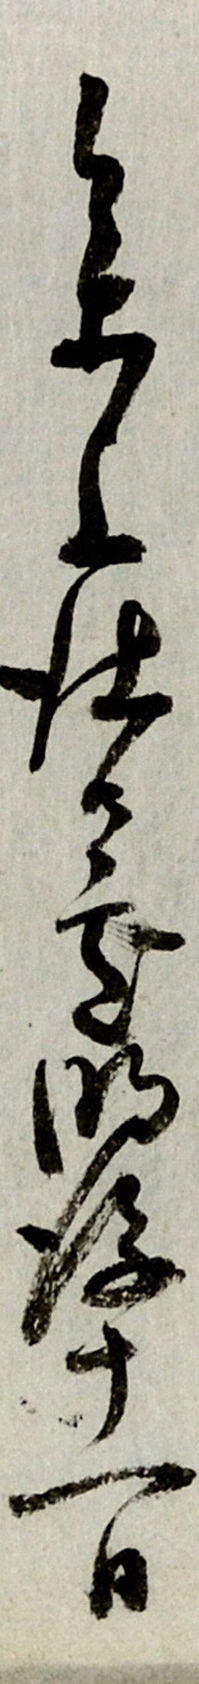参上仕候処明後十一日
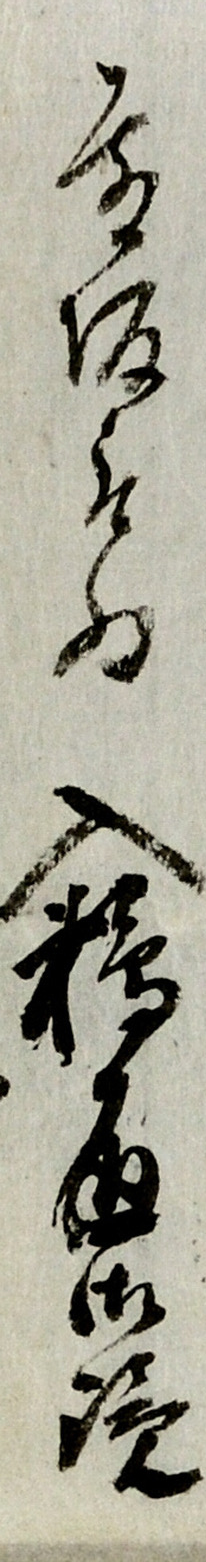殿坂被為入鵜匠御覧
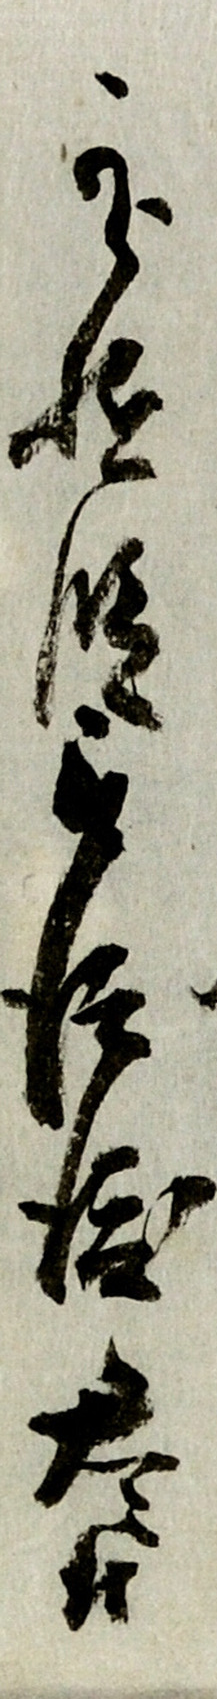可被遊段被仰渡候右ニ付
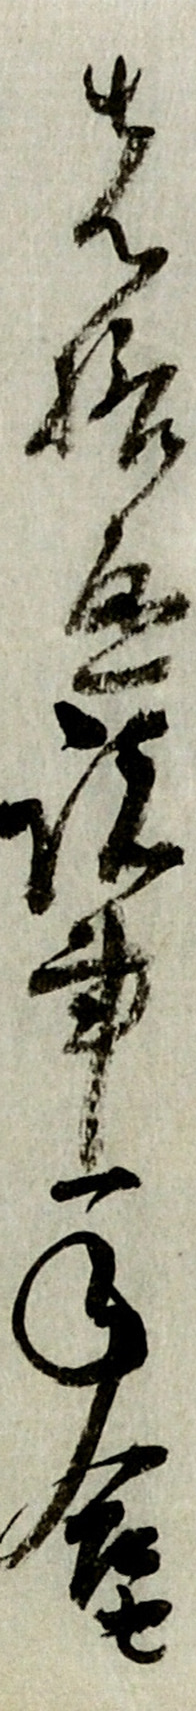先格通諸事承合セ
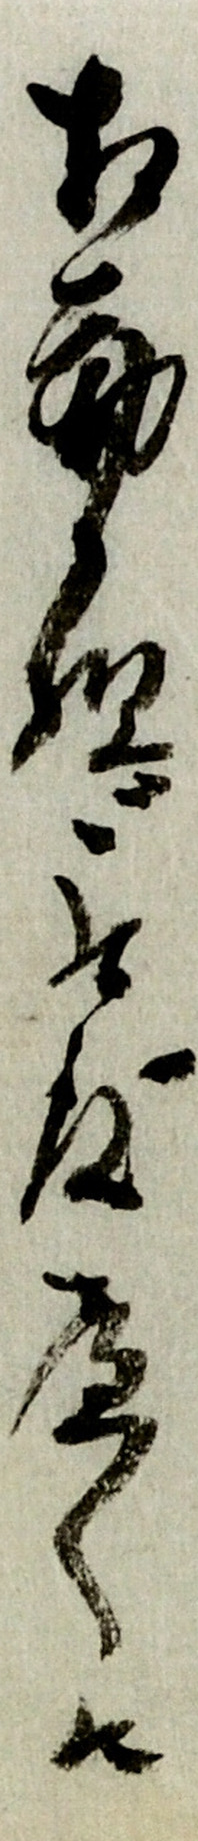相勤候様ニ被致へく候
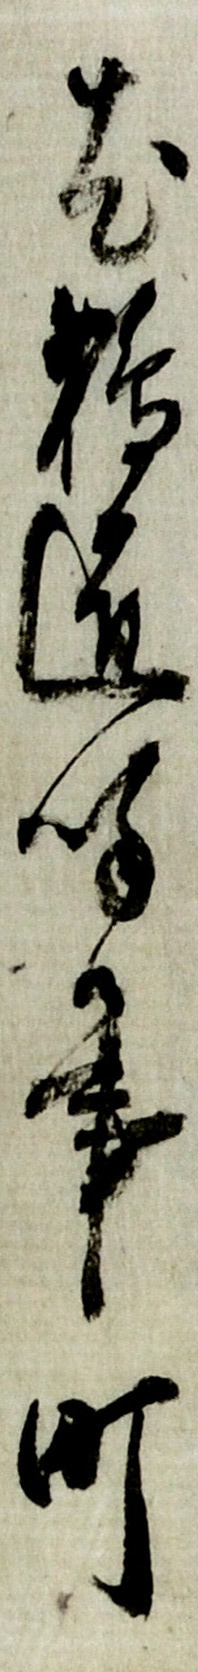尤鵜匠呼候事町

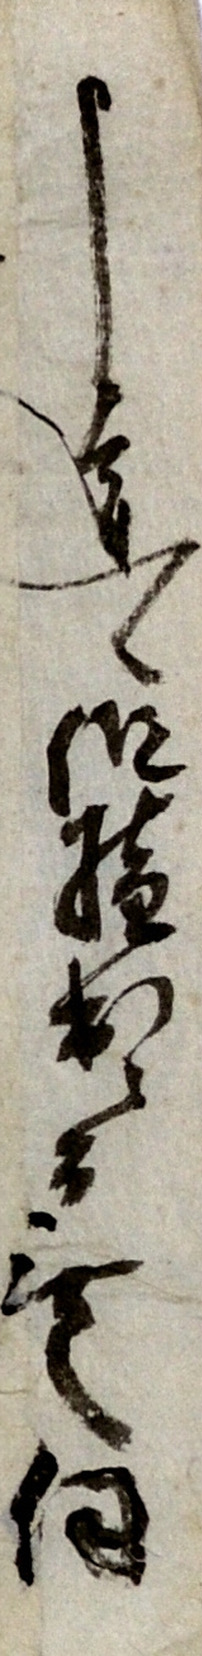申達候但指出に而無之伺
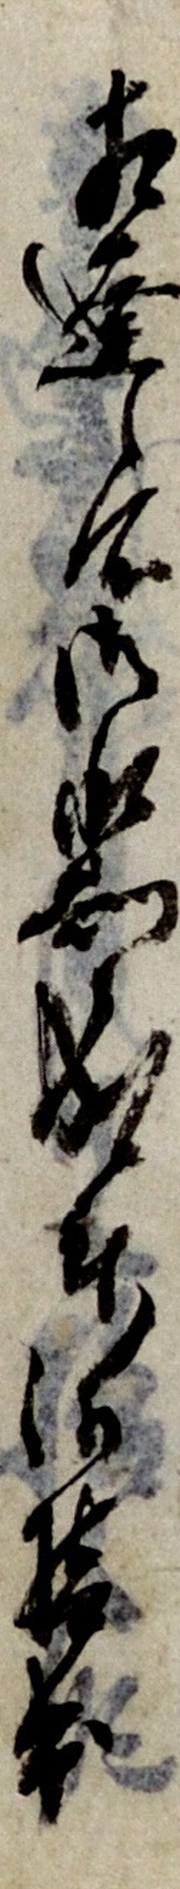相達候所御承知被成候付御指出
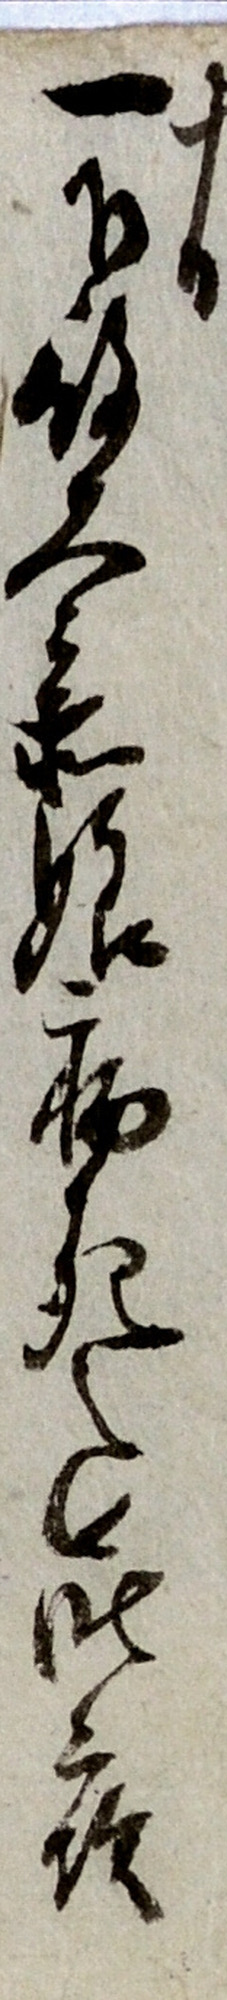一下役久兵衛娘病死之由昨夜
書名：分一方諸事御用留帳
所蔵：伊那市立高遠町図書館・合同会社AMANE
